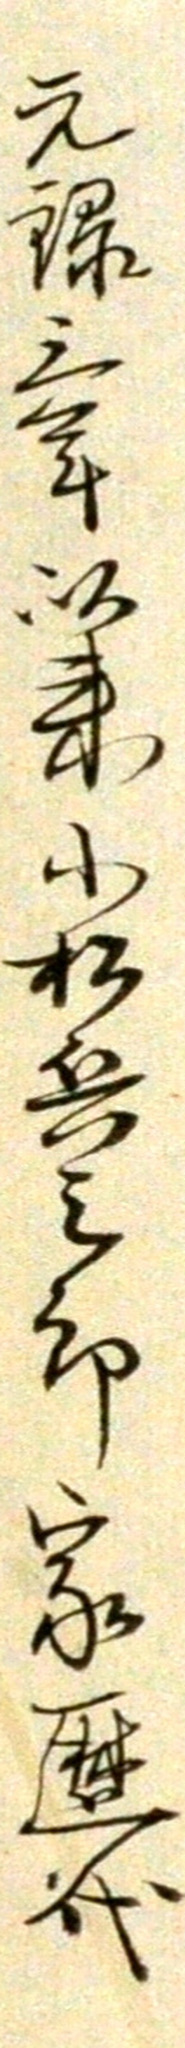元録三年以来小松兵三郎家歴代
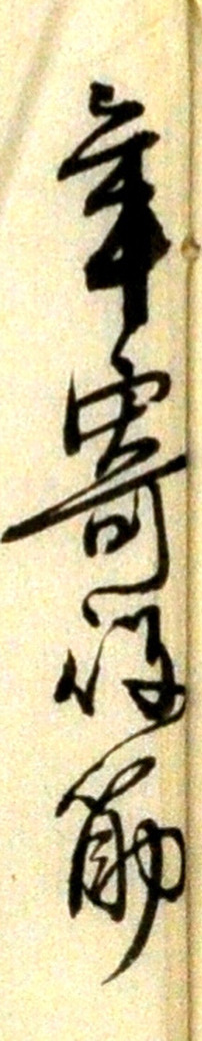年寄役筋
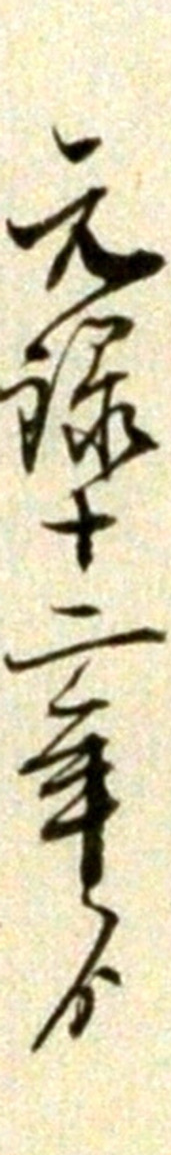一元録十二年ゟ
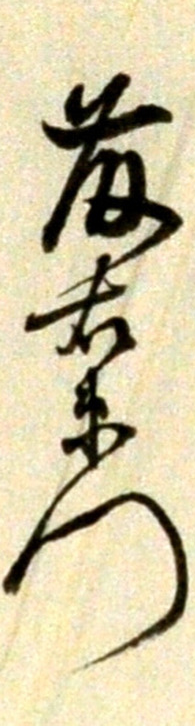藤右衛門
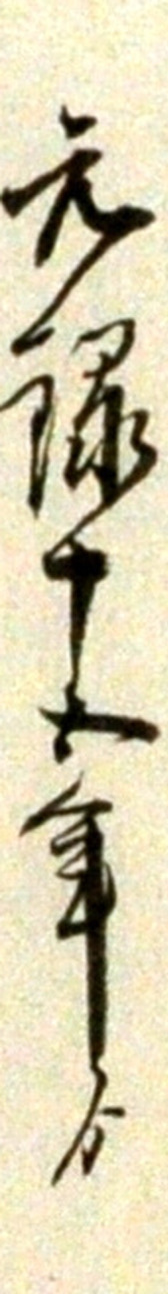元録十五年ゟ
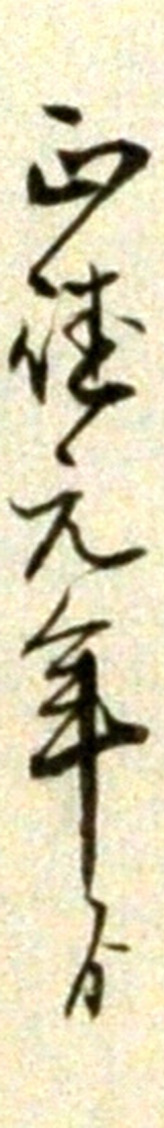正徳元年ゟ
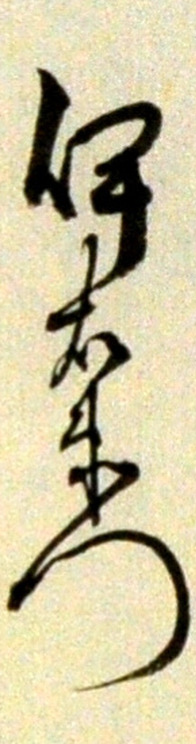藤右衛門

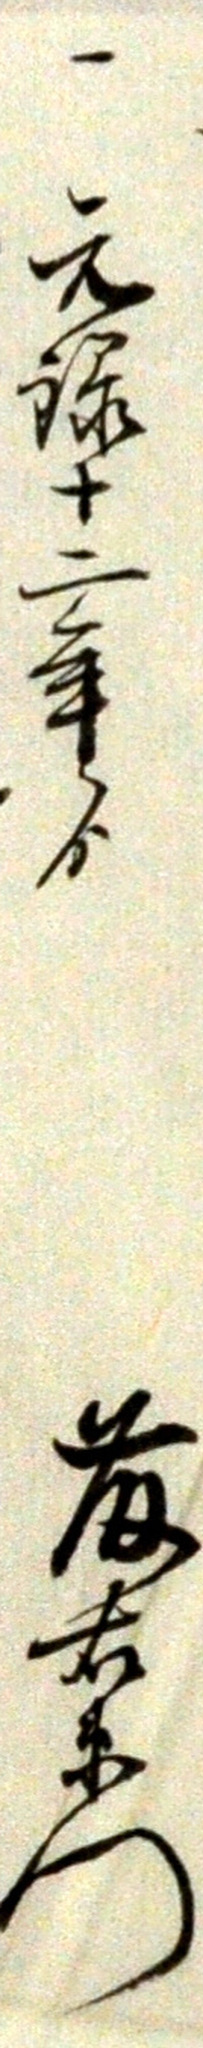一天明三年ゟ藤右衛門
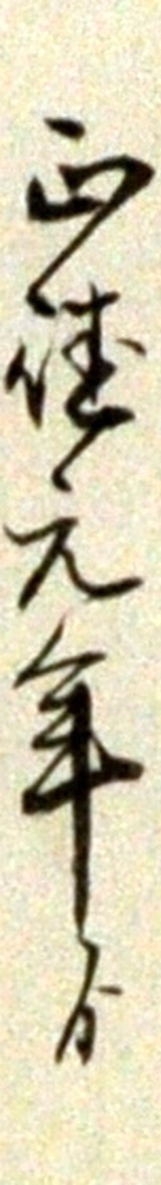寛政元年ゟ
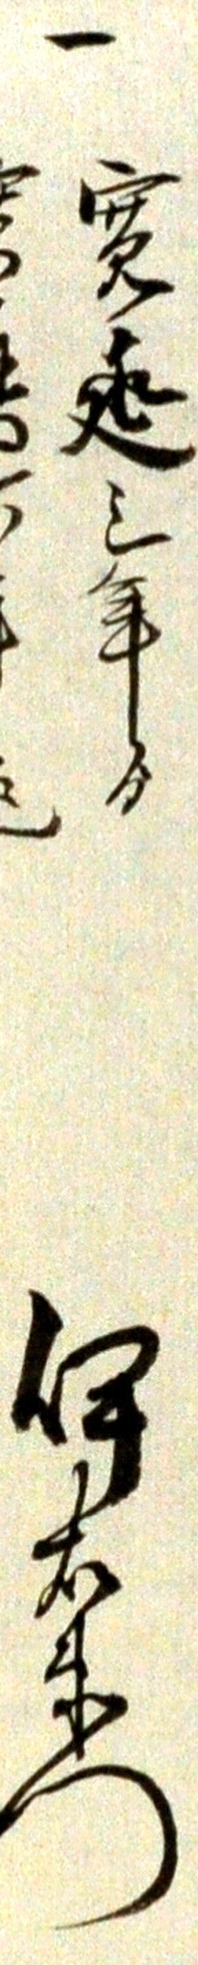一寛延三年ゟ伊右衛門
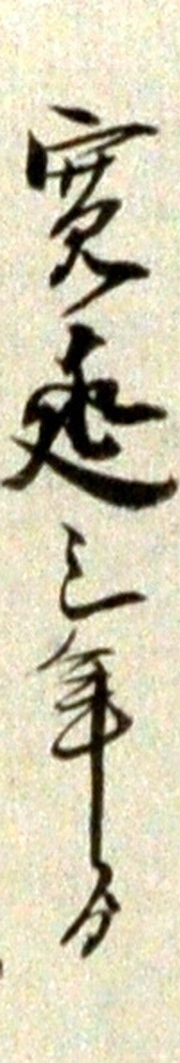寛政元年ゟ
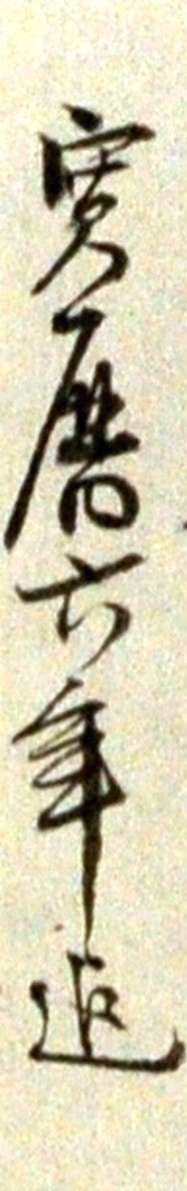宝暦七年ゟ
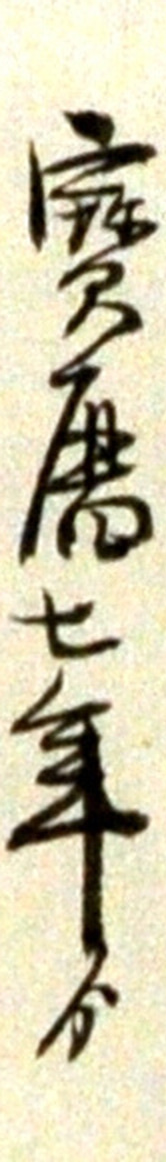宝暦七年ゟ
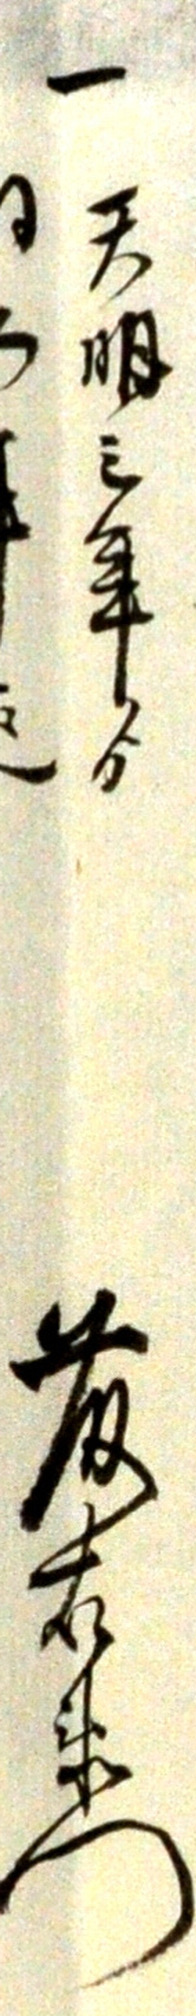一天明三年ゟ藤右衛門
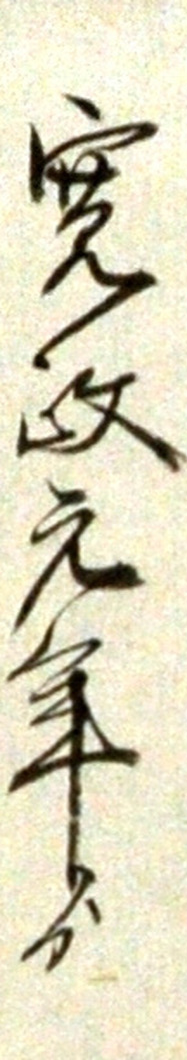寛政元年ゟ

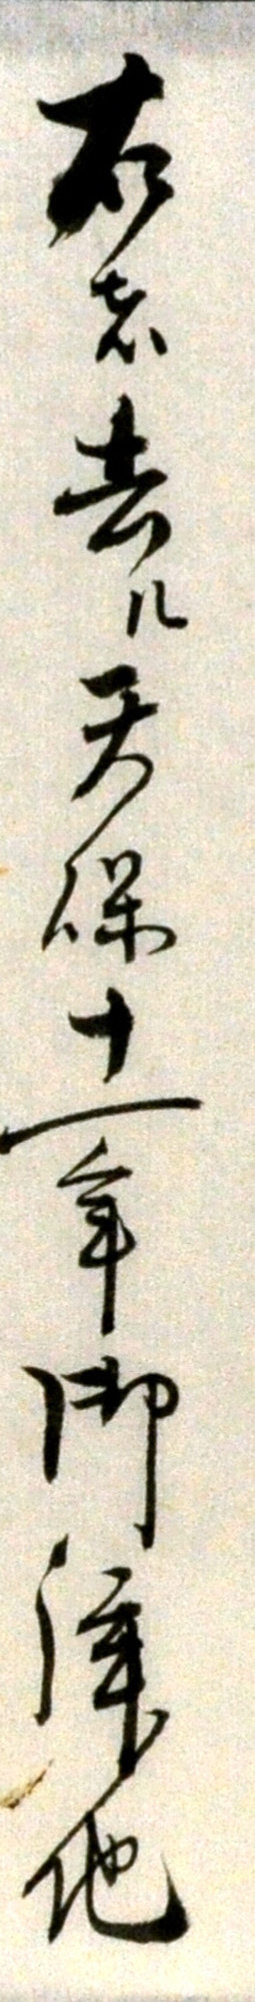右者去ル天保十一年御拝地
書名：小松家古系図写・一通、浦村家筋帳抜粋・一通
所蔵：伊那市立高遠町図書館・合同会社AMANE
